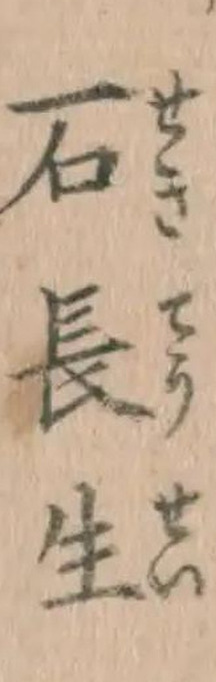石長生
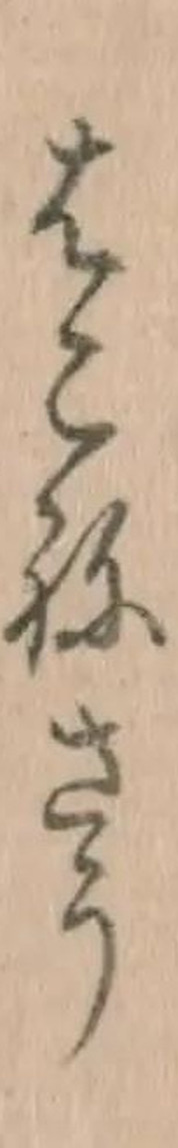はこねさう
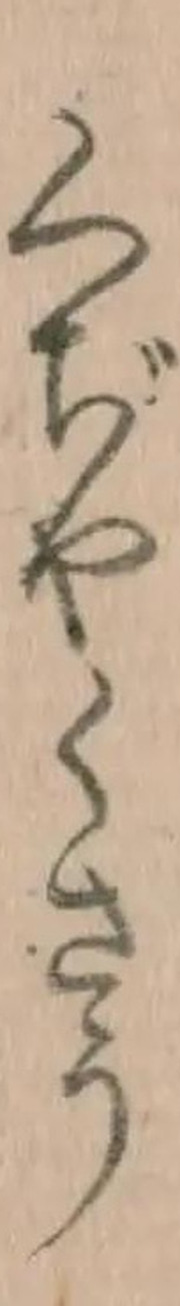くぢやくさう
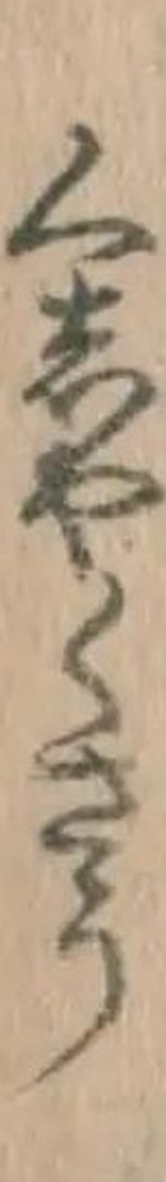くしやくさう

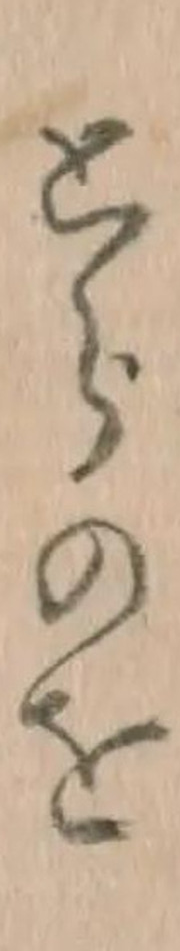とらのを
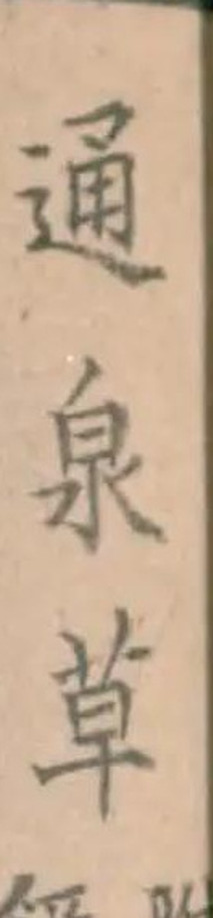通泉草
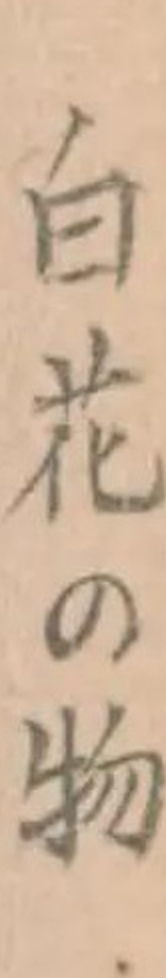白花の物
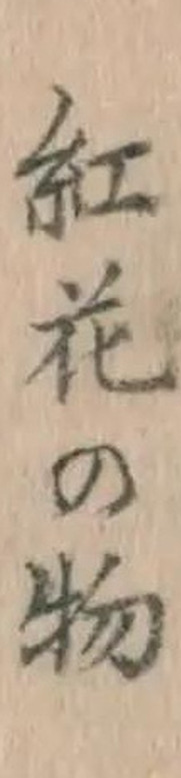紅花の物
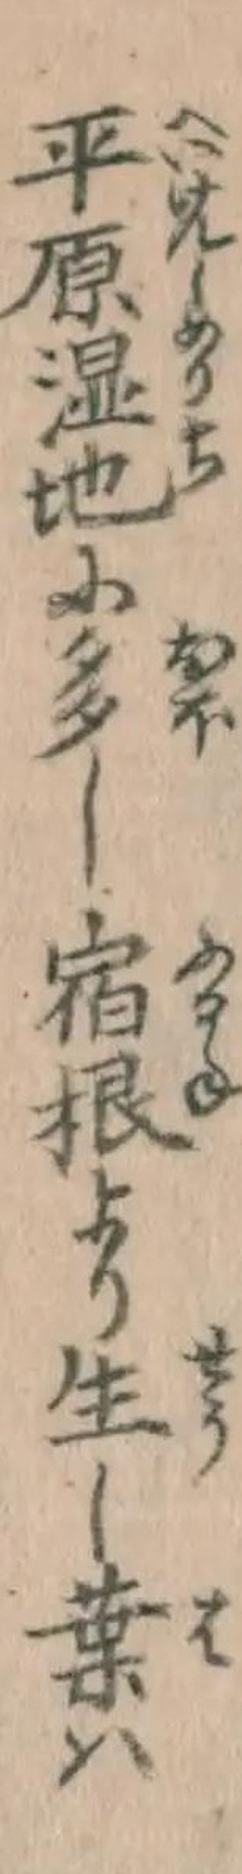平原湿地に多し宿根より生し葉は
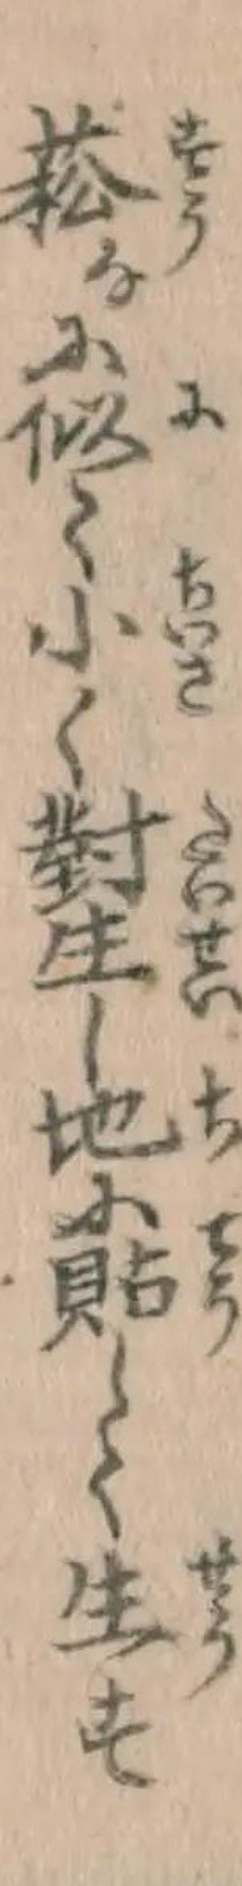菘に似て小く対生し地に貼して生す
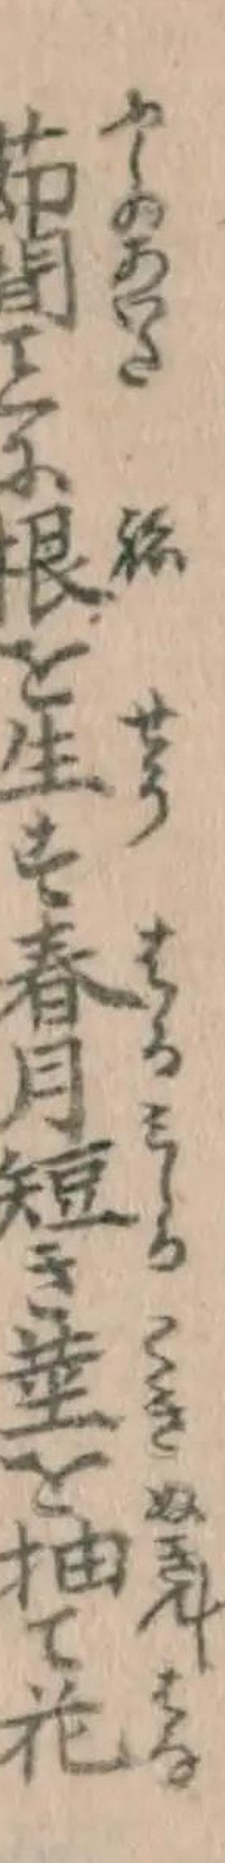節間ことに根を生す春月短き茎を抽て花
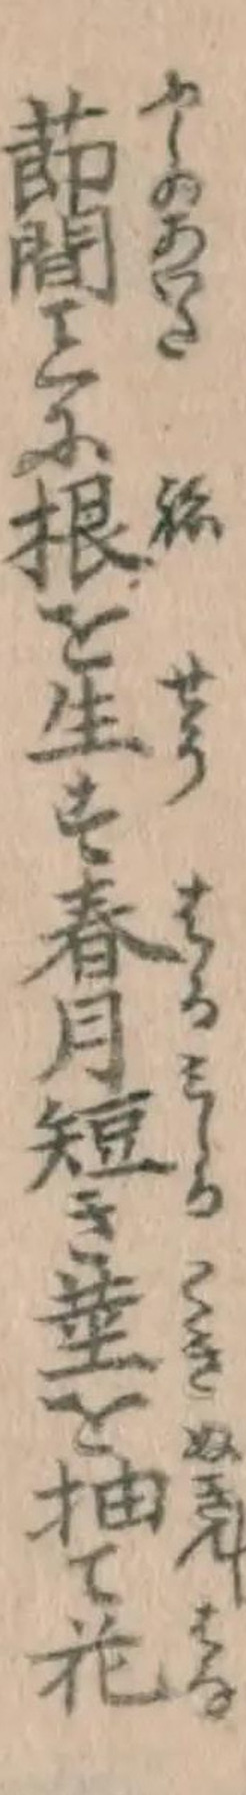節間ことに根を生す春月短き茎を抽て花
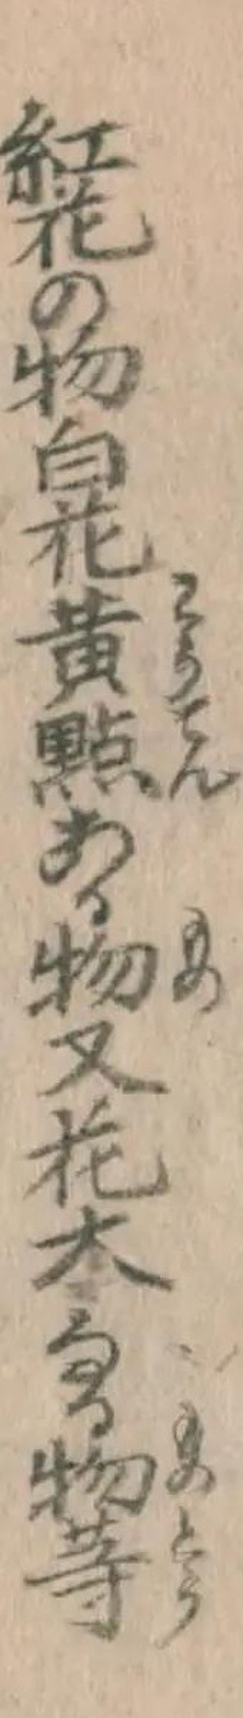紅花の物白花黄点ある物又花大なる物等

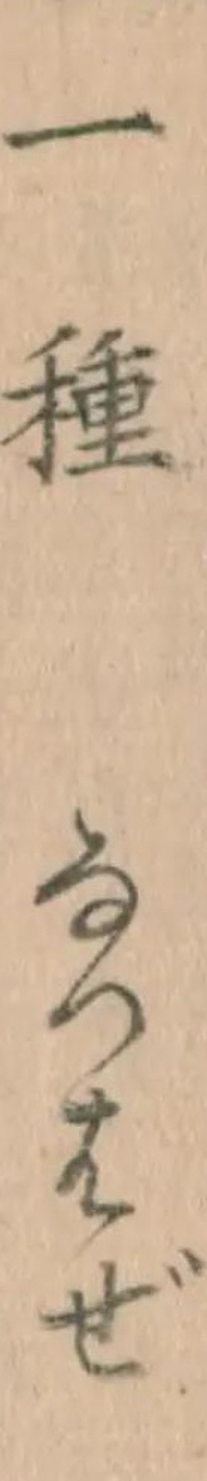一種なつはぜ
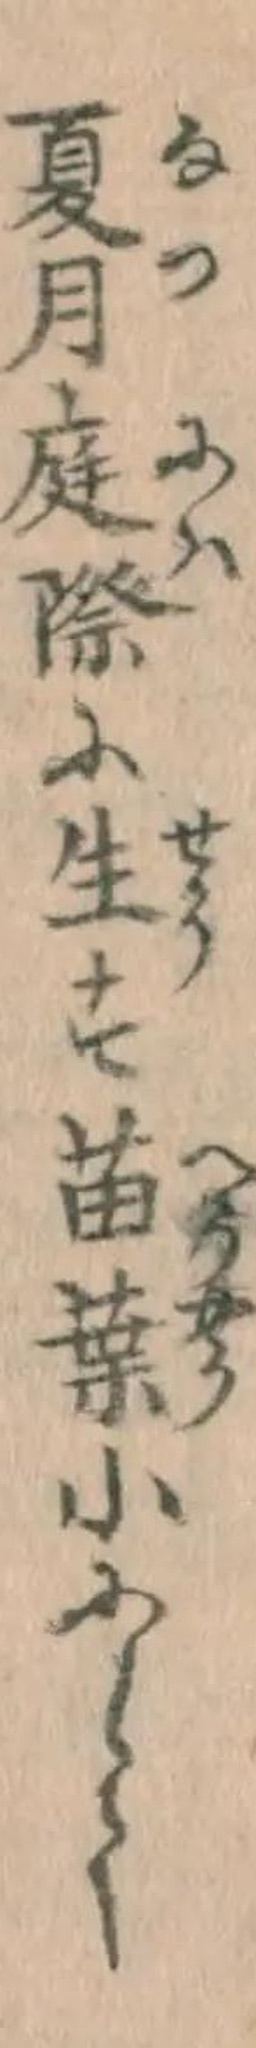夏月庭際に生す苗葉小にして
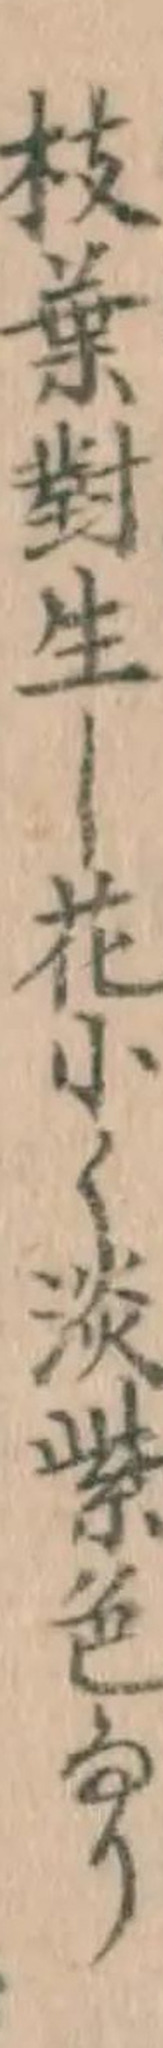枝葉対生し花小く淡紫色なり
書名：本草図譜. 巻34-36
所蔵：国立国会図書館 National Diet Library, JAPAN
